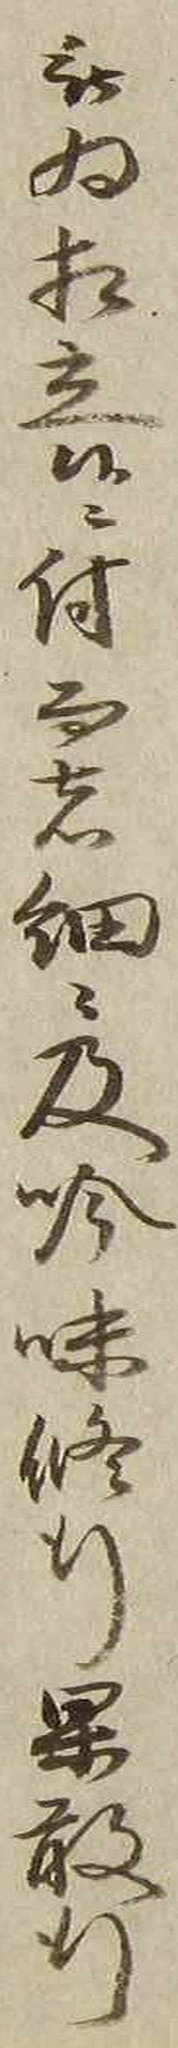被為相立候に付而は細々及吟味修行果敢行
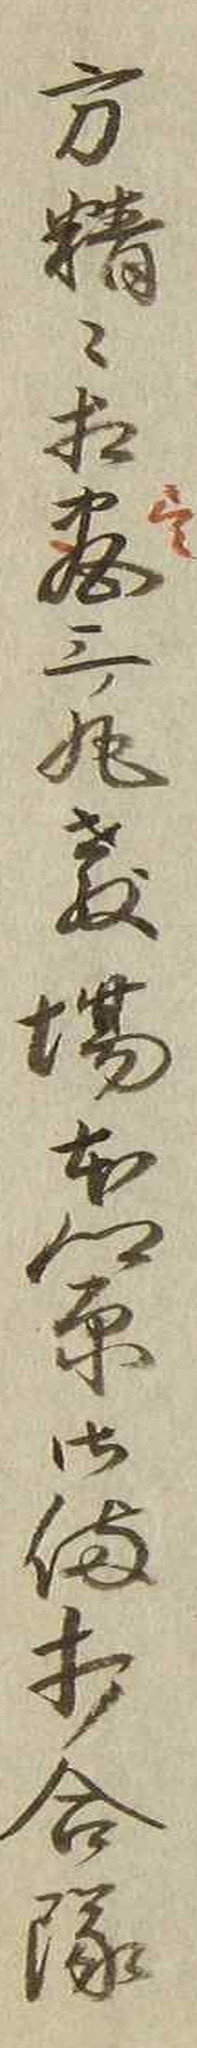方精々相尽三ノ丸教場本郷原御備打合隊
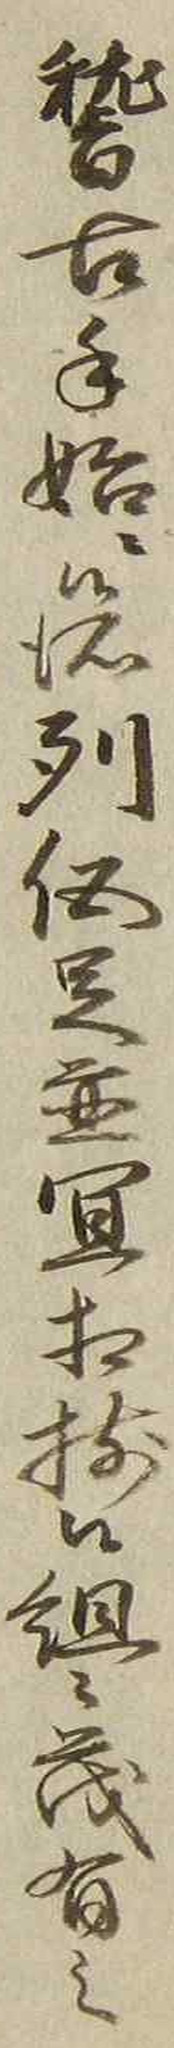稽古手始に候所諸列伍足並宜相揃候組々も有之
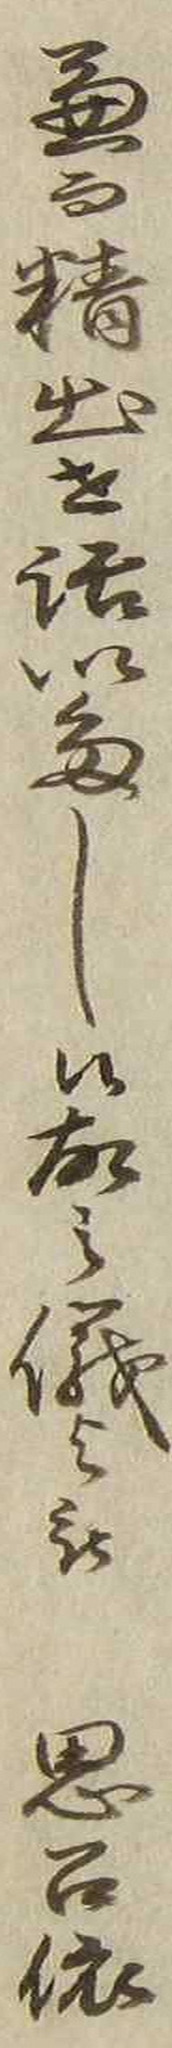兼而精出世話いたし候故之儀と被思召依

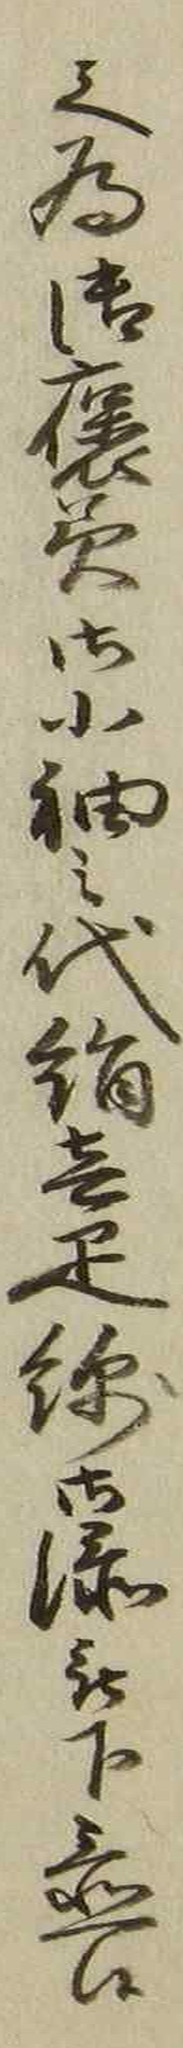之為御褒美御小袖之代絹壱疋綿御添被下置候
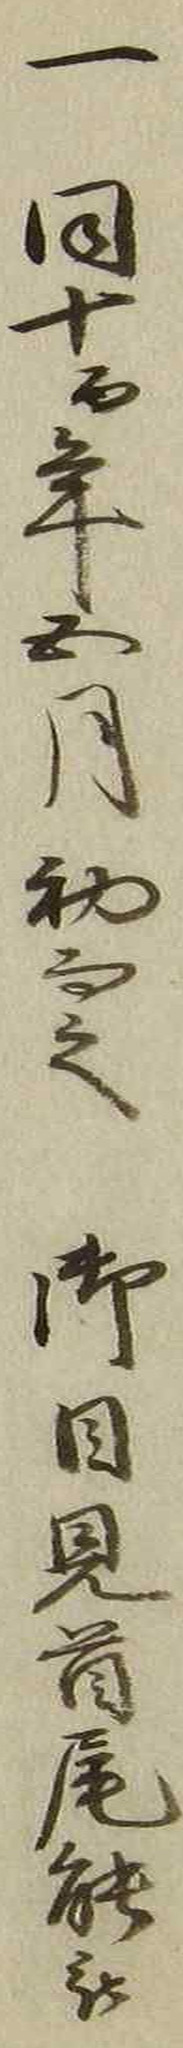一同十酉年五月初而之御目見首尾能被
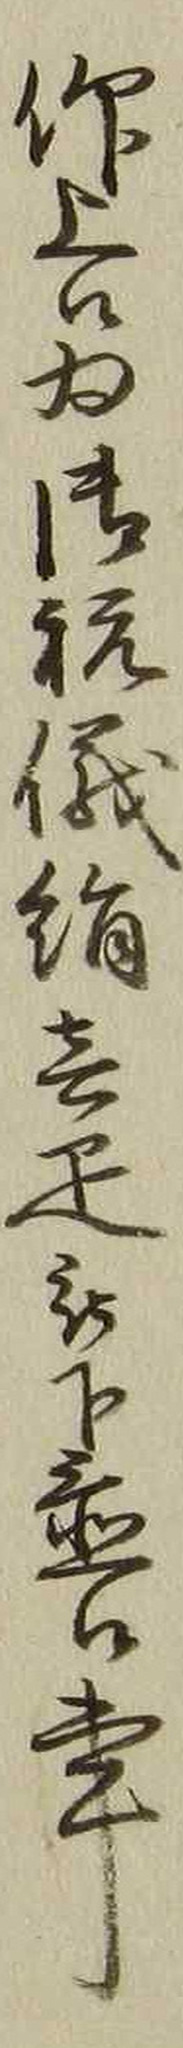仰上候為御祝儀絹壱疋被下置候事
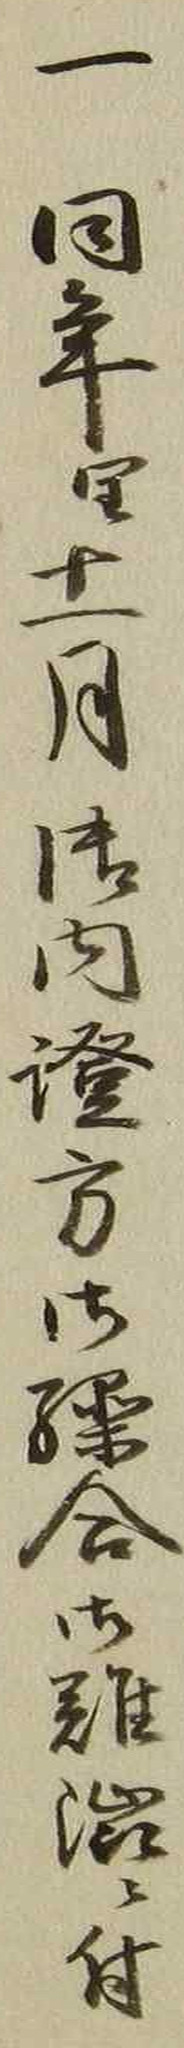一同年閏一月御内証方御繰合御難渋に付
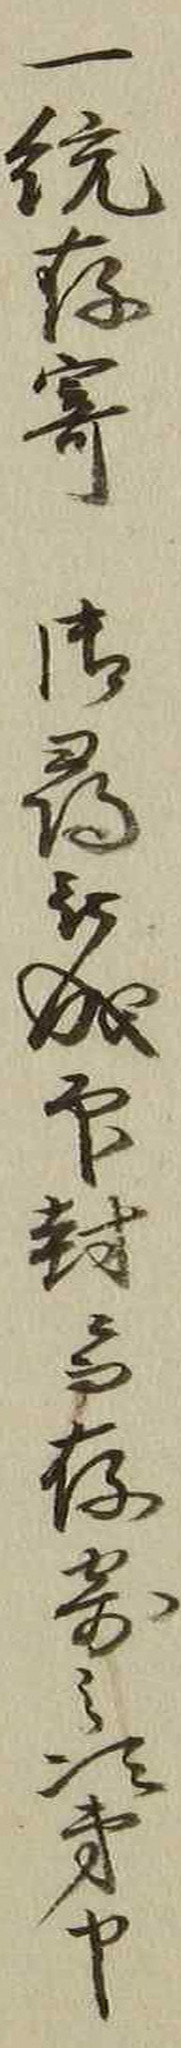一統存寄御尋被成印封に而存寄之次第申
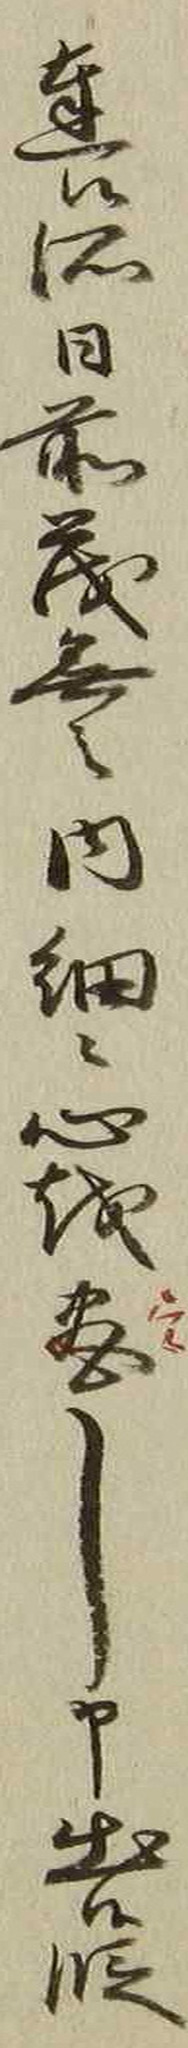達候所日前も無之内細々心を尽し申出候段
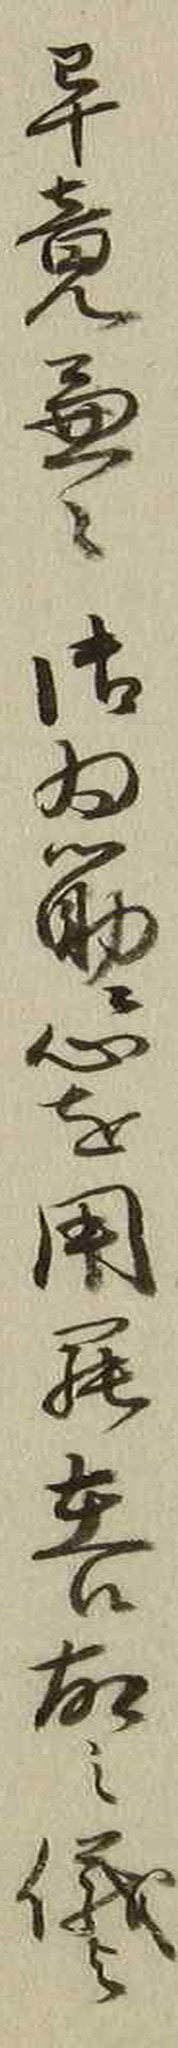畢竟兼々御為筋に心を用罷在候故之儀と
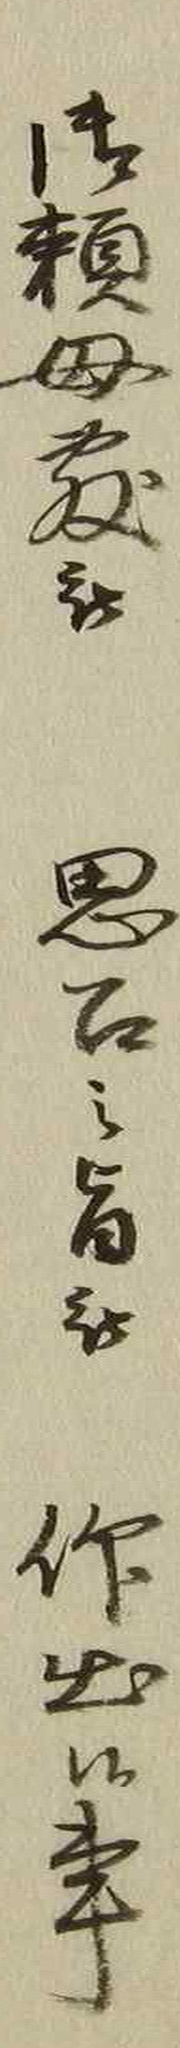御頼母敷被思召之旨被仰出候事
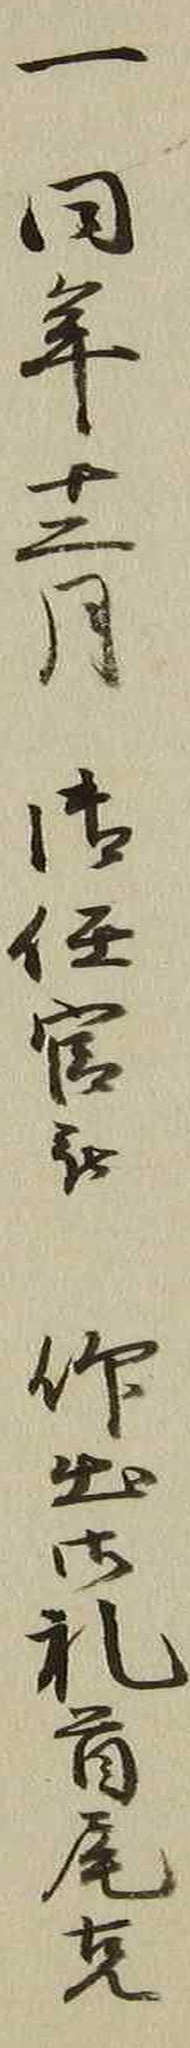一同年十二月御任官被仰出御札首尾克
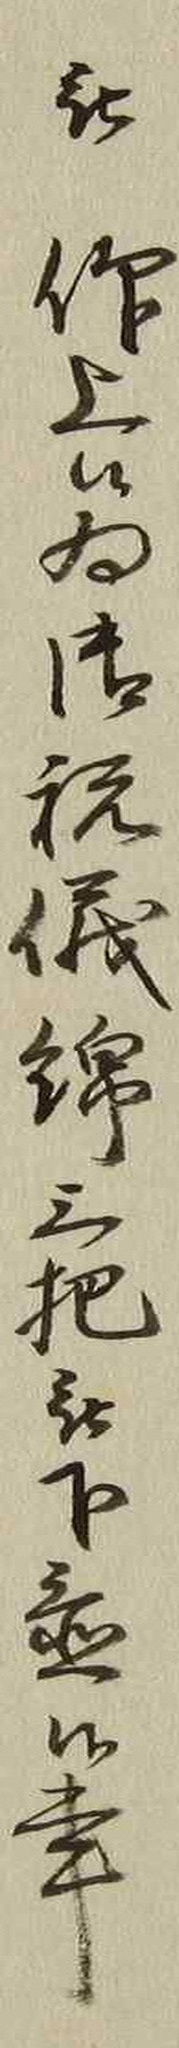被仰上候為御祝儀綿三把被下置候事
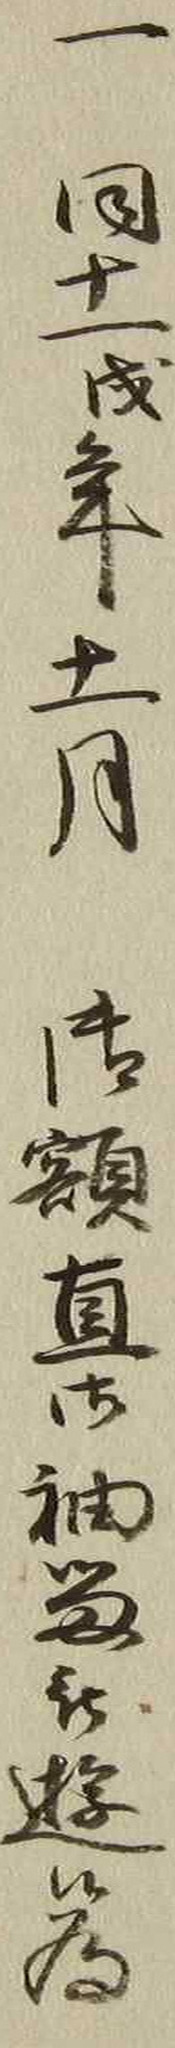一同十一戌年十一月御額直御袖留被遊候為
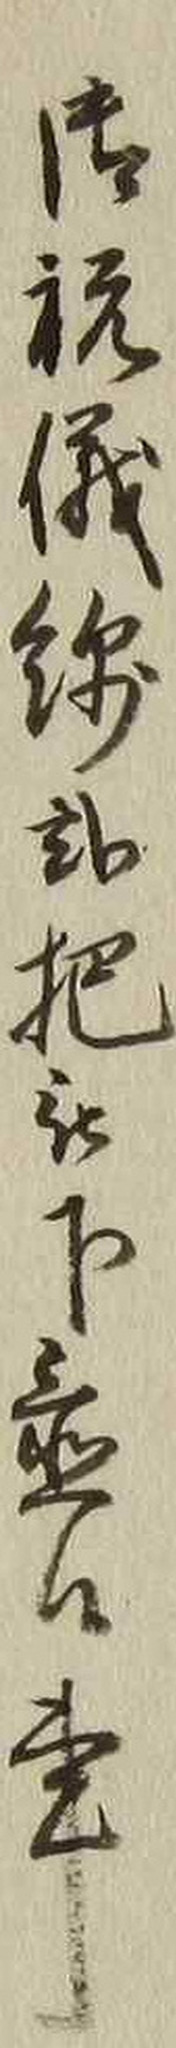御祝儀綿弐把被下置候事
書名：諸士系譜　巻之133　た之部9
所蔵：会津若松市立会津図書館
